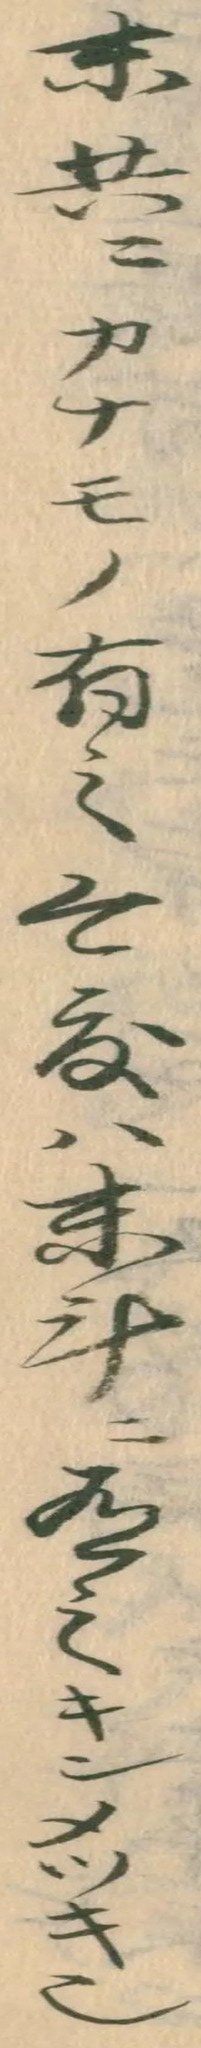末共ニカナモノ有之今度ハ末計ニ有之キンメツキ也
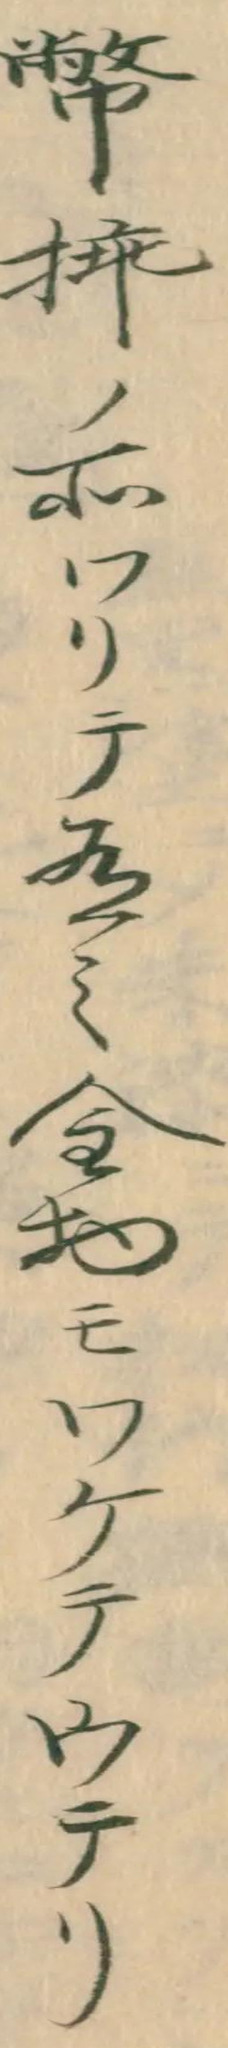幣挿ノ所ワリテ有之金物モワケテウテリ
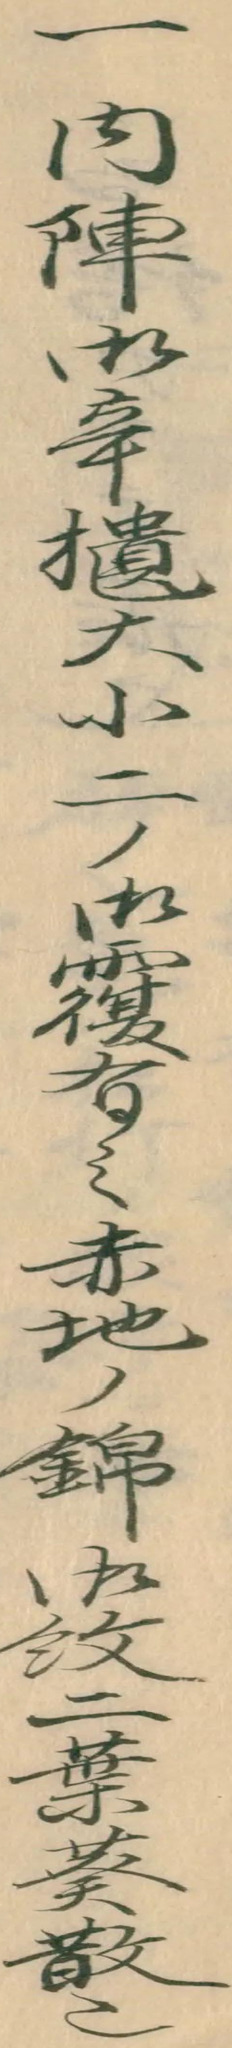一内陣御辛櫃大小二ノ御覆有之赤地ノ錦御紋二葉葵散也
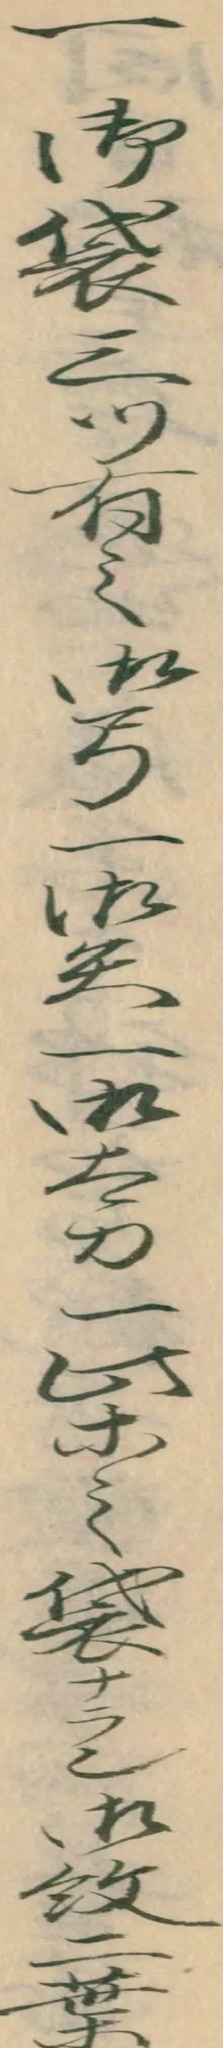一御袋三ツ有之御弓一御矢一御太刀一此等之袋ナラン御紋二葉
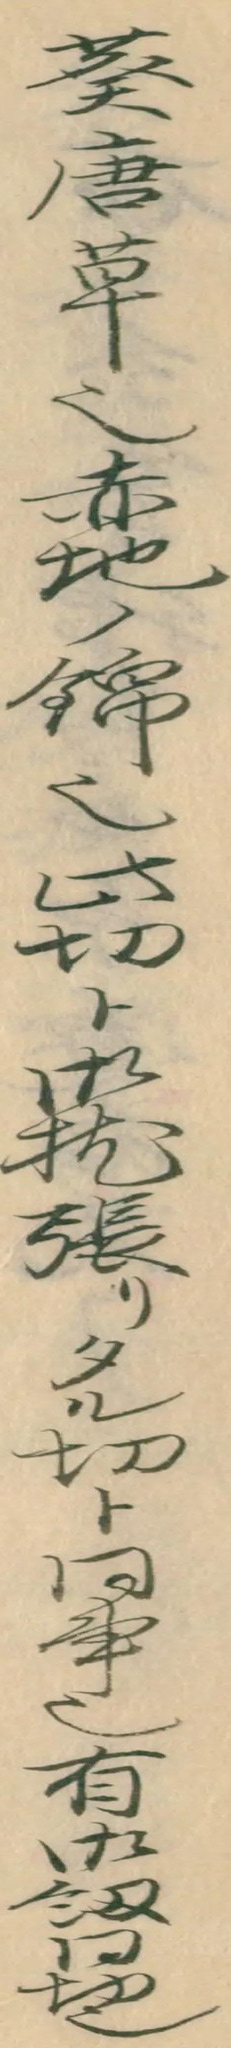葵唐草也赤地ノ錦也此切ト御枕張リタル切ト同事也有御紐同切也
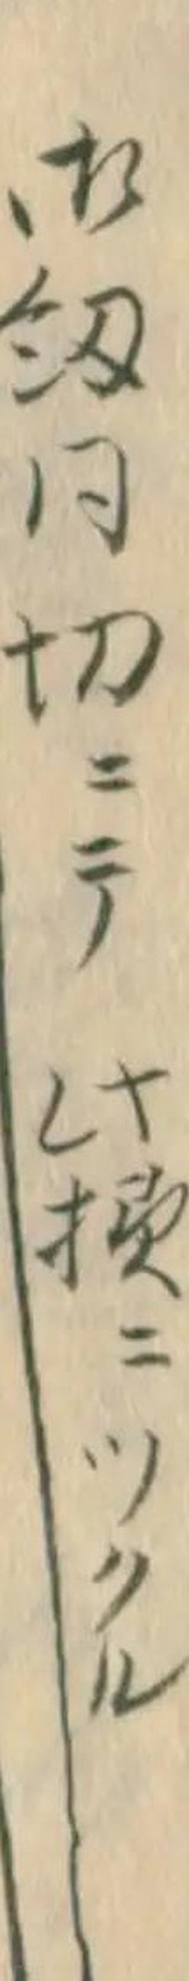御紐同切ニテ此様ニツクル
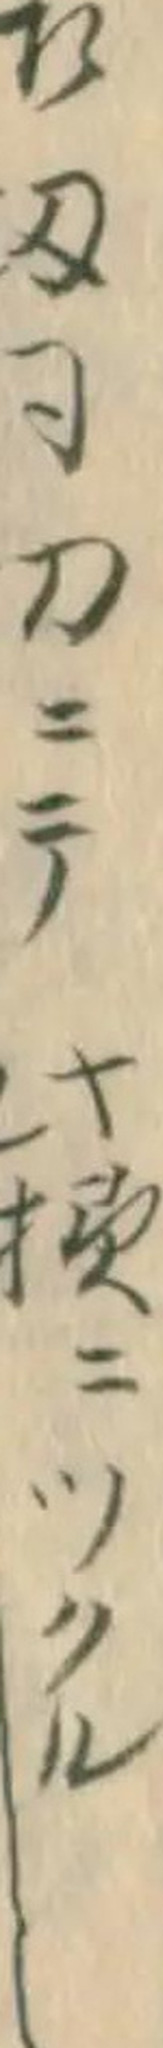御紐同切ニテ此様ニツクル
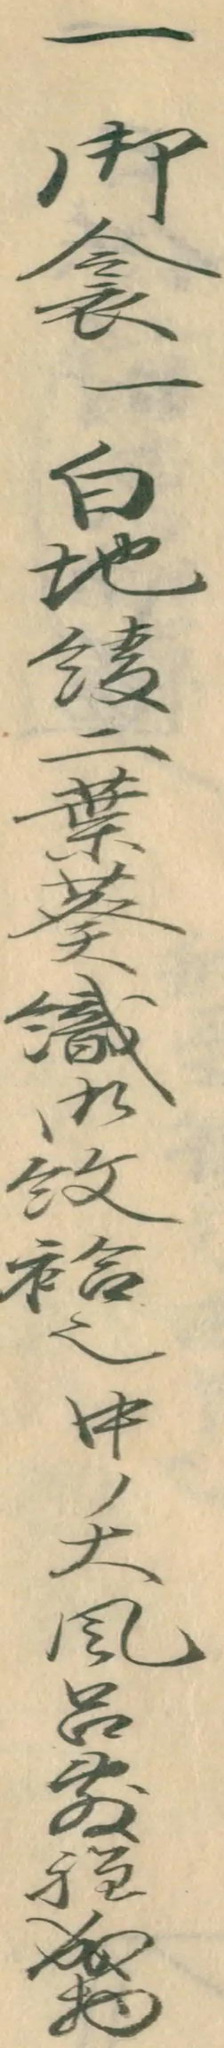一御衾一白地綾二葉葵織御紋袷也中ノ大風呂敷程成物
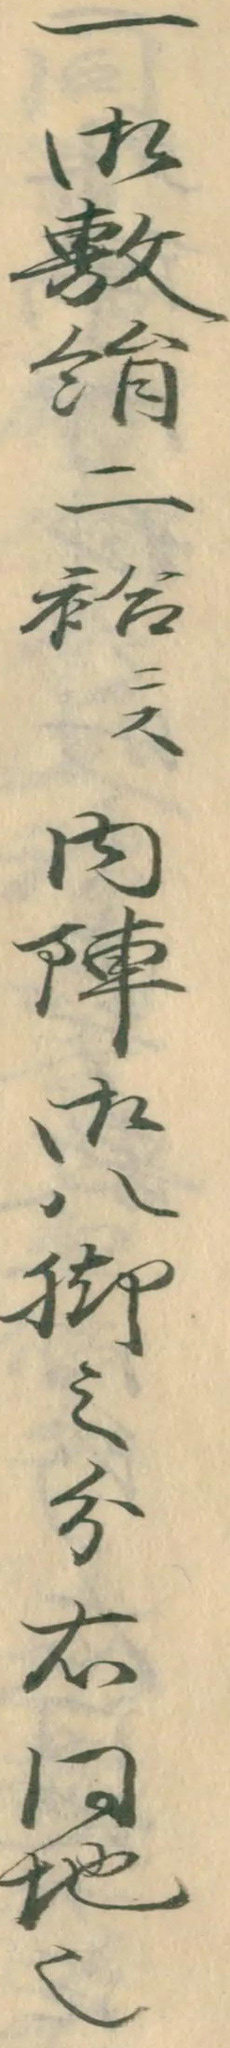一御敷絹二袷ニス内陣御八脚之分右同地也

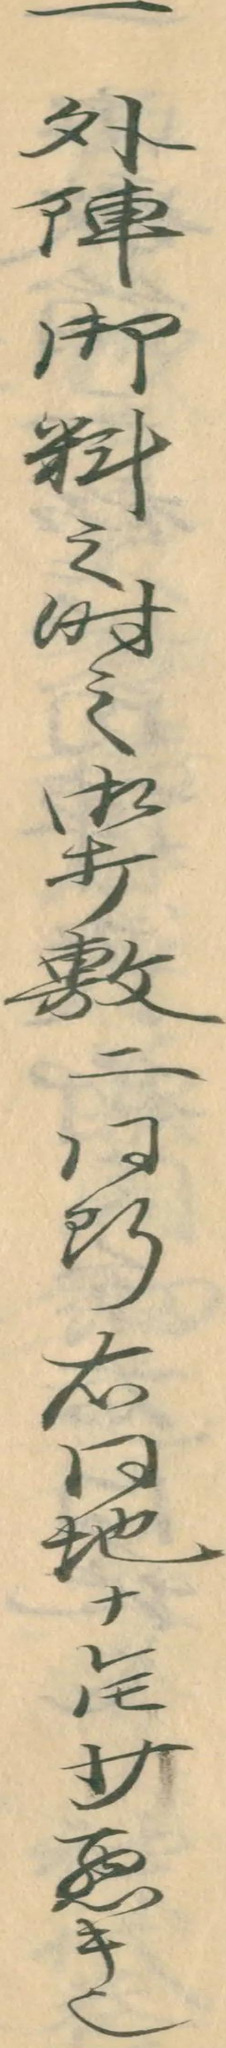一外陣御料之時之御打敷二同断右同地ナレトモ少悪キ也
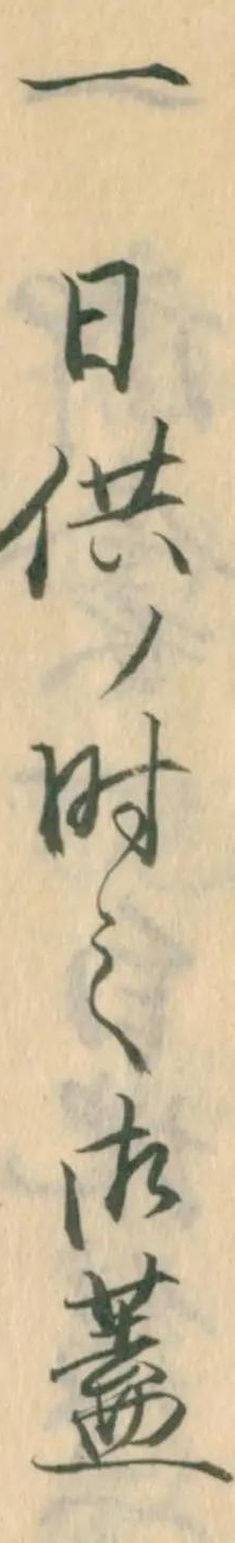一日供ノ時之御蓋
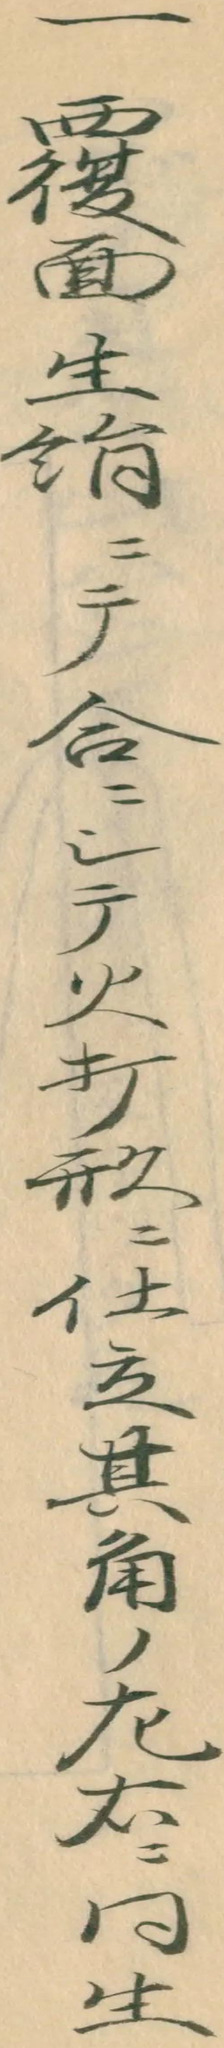一覆面生絹ニテ合ニシテ火打形ニ仕立其角ノ左右ニ同生
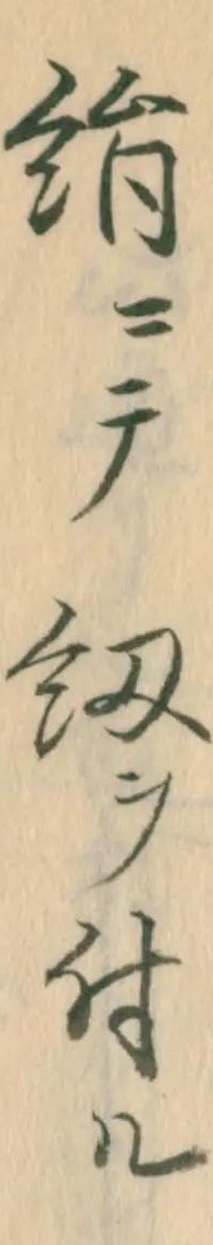絹ニテ紐ヲ付ル
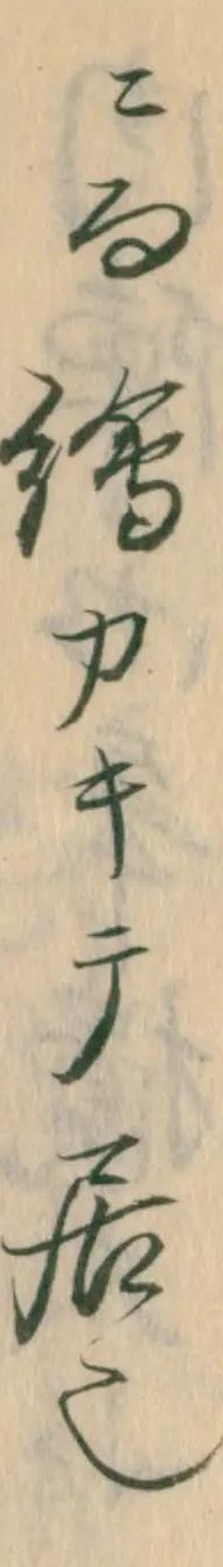ニ而絵カキテ居也
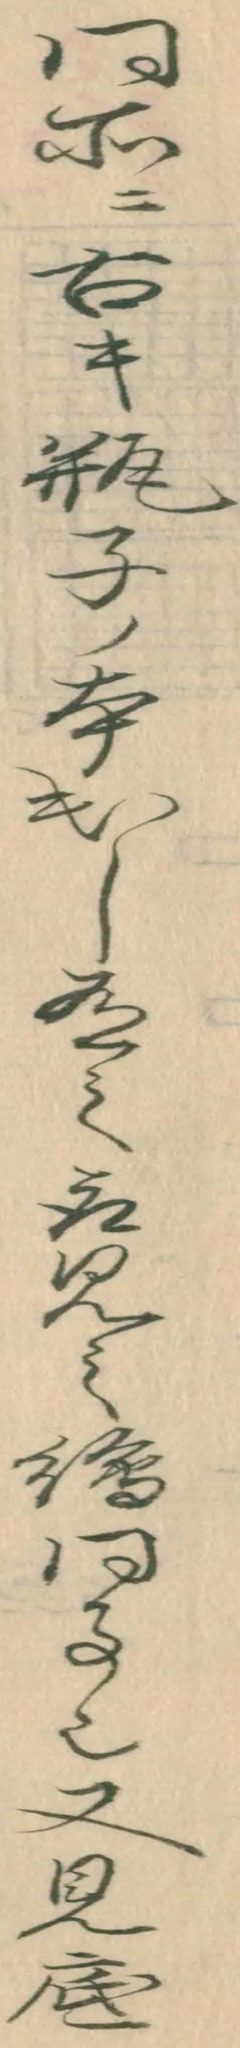同所ニ古キ瓶子ノ本出し有之取見之絵同事也又見底
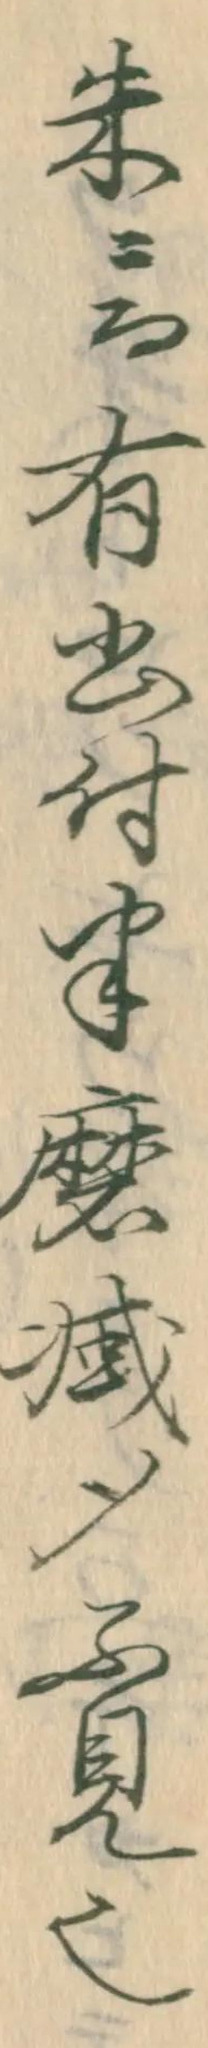朱ニ而有書付半磨減シテ不見也
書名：賀茂社記録. 第15冊
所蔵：国立国会図書館 National Diet Library, JAPAN
